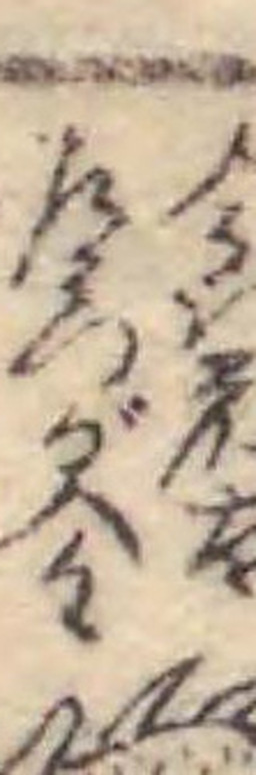左衛門が金
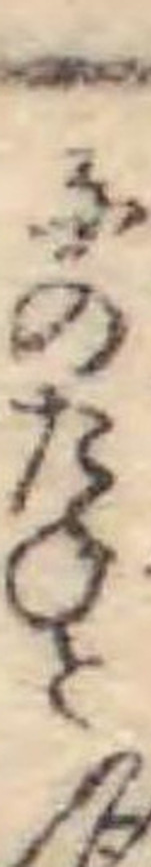子のたねと
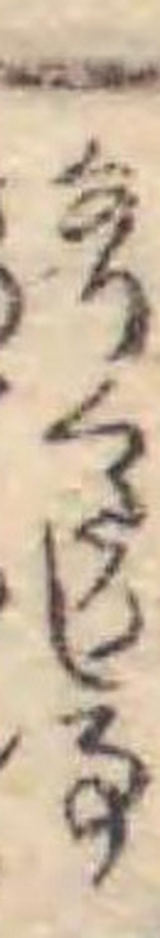なりくたりし事
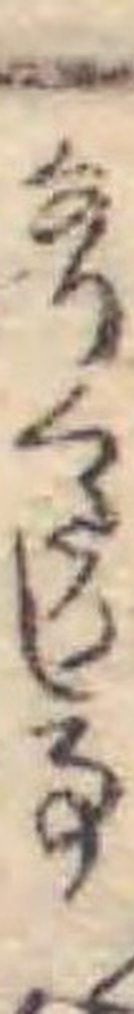なりくたりし事
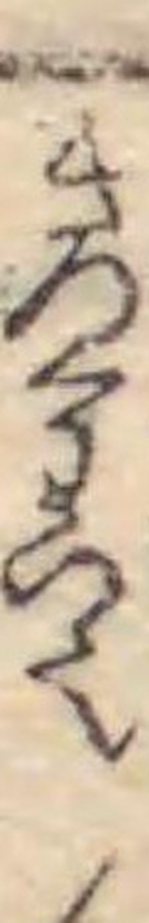きつくわい也
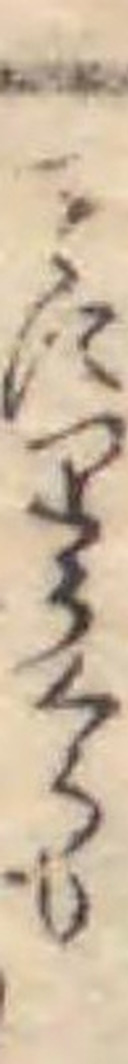ことにりうくうも
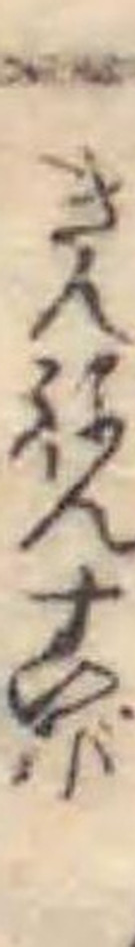きんねんすいび
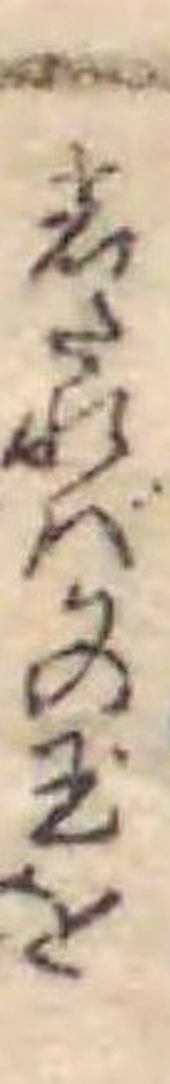したればかの玉を
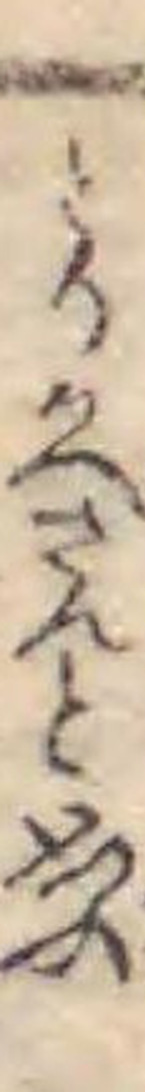とりかへさんと思ふ
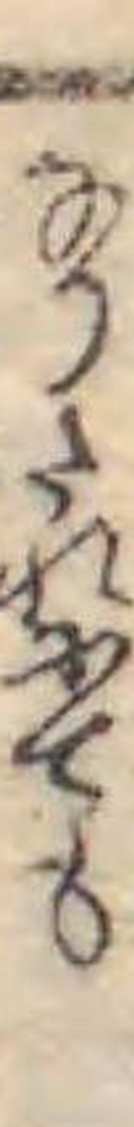なりたれにても
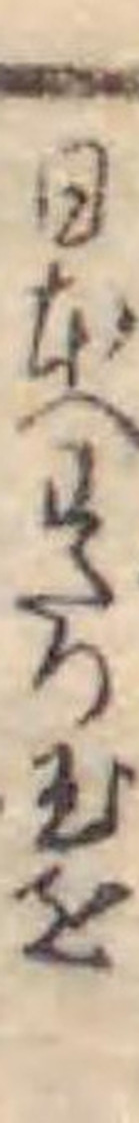日本へわたり玉を
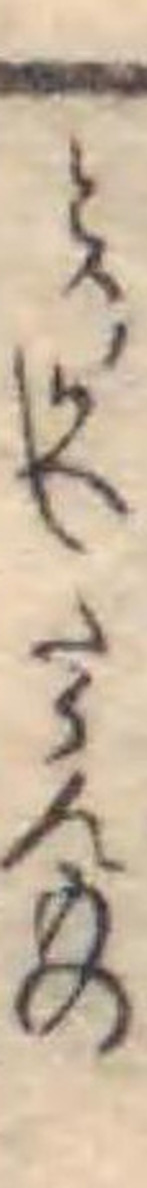とりかへしたらんもの
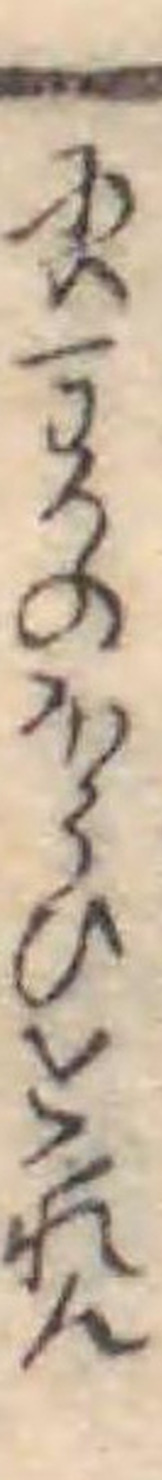には一わり？のほうひをくれん
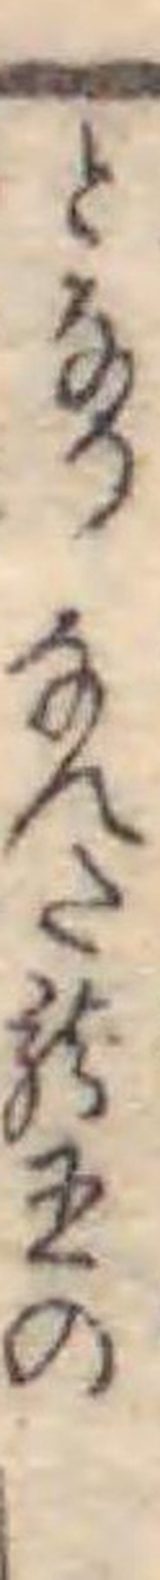となりなんた龍王の
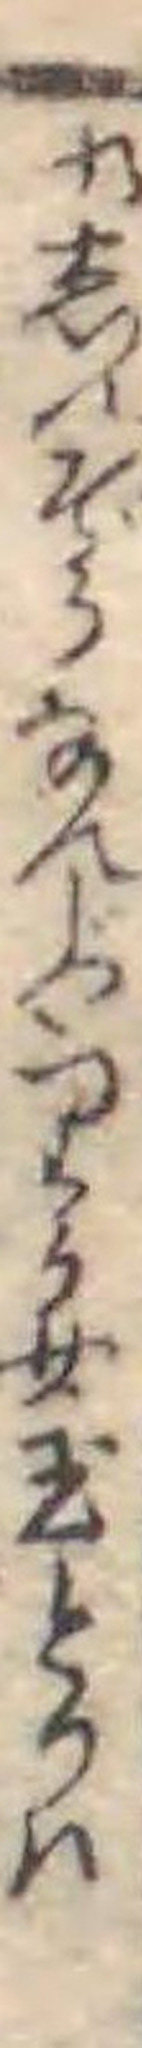御しんぞうなんじやりう女玉とりは
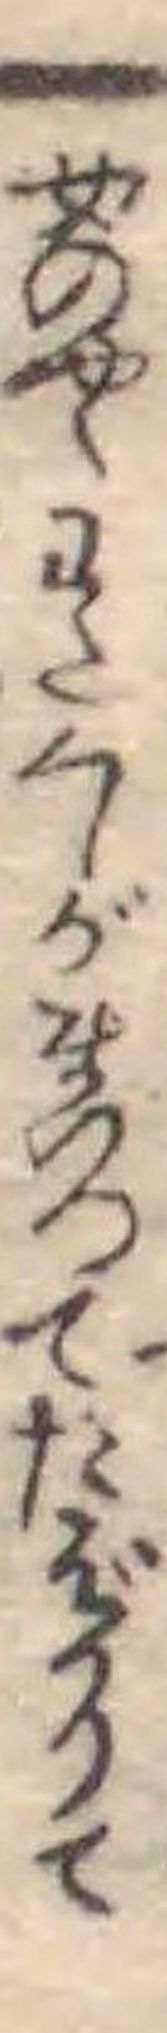女のやくわたくしがまいつてたばかりて
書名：鐘入七人化粧 : 3巻
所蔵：国立国会図書館 National Diet Library, JAPAN
